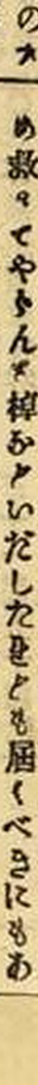め救けてやらんと棹なといだしたれども届くべきにもあ
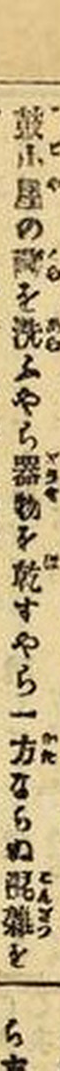鼓小屋の藏を洗ふやら器物を乾すやら一方ならぬ混雜を
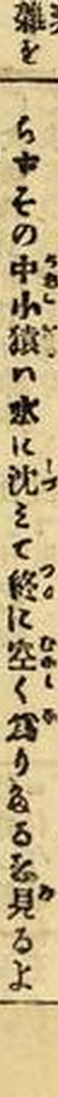らずその中小猿は水に沈みて終に空く爲りたるを見るよ
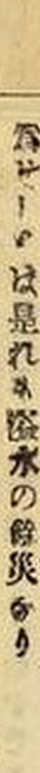爲せしとは是れも溢水の餘災なり
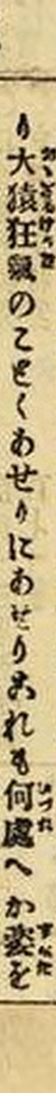り大猿狂氣のことくあせりにあせりこれも何處へか姿を
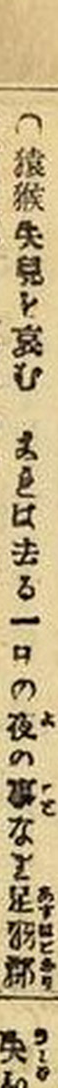○猿猴失兒を哀むこれは去る一日の夜の事なり足羽郡
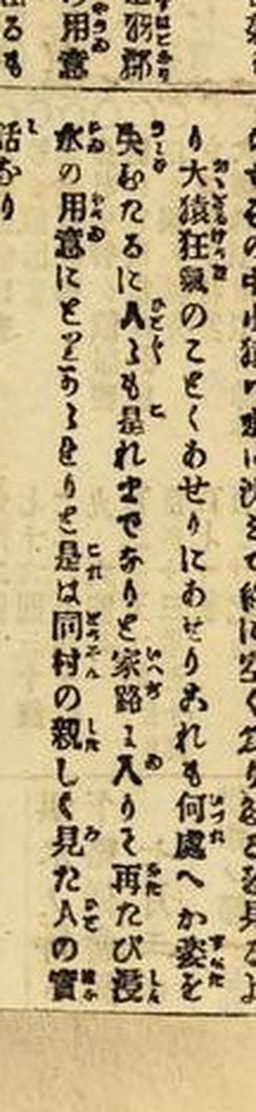失ひたるに人々も是れまでなりと家路に入りて再たび浸
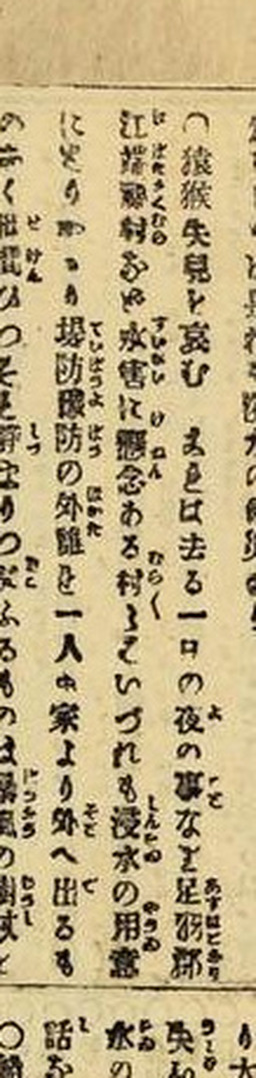江端福村など水害に懸念ある村々はいづれも浸水の用意
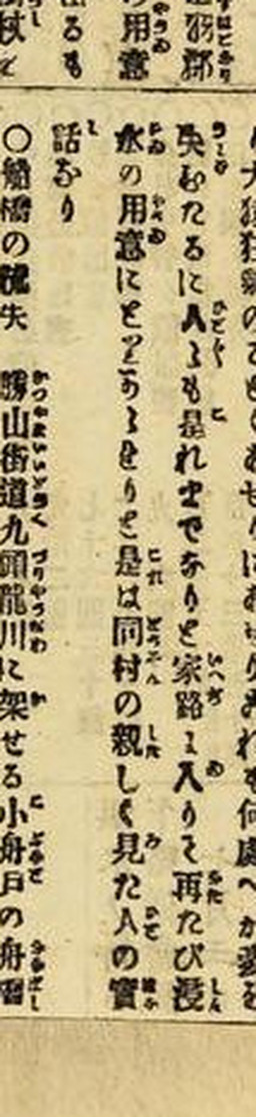水の用意にとりかゝれりと是は同村の親しく見た人の實
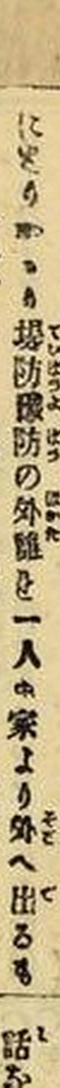にとりかゝり堤防豫防の外誰れ一人も家より外へ出るも
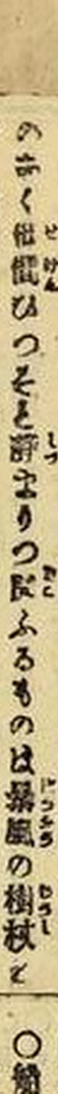の無く世間ひつそと靜まりつ聞ふるものは暴風の樹枝を
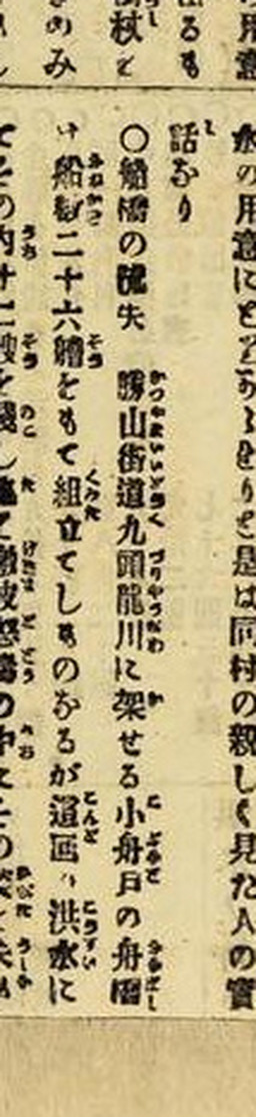○船橋の流失勝山街道九頭龍川に架せる小舟戸の舟橋
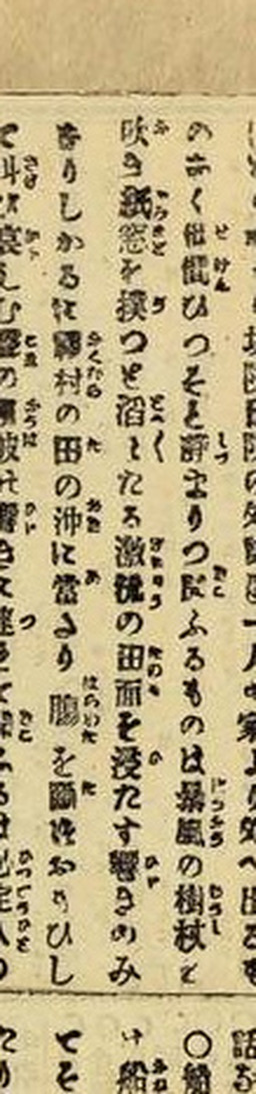吹き紙窓を撲つと滔々たる激流の田面を浸たす響きのみ
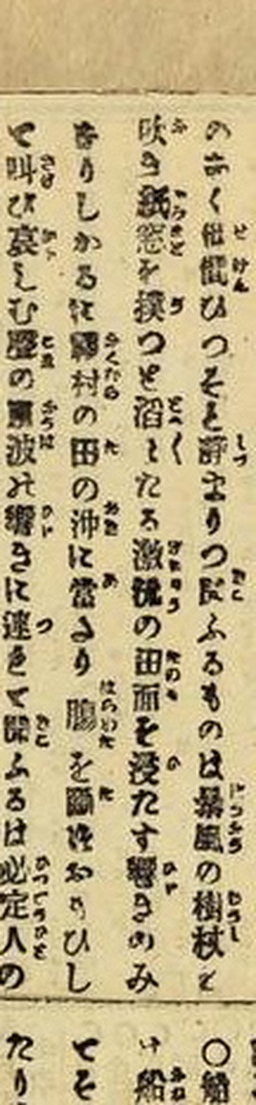吹き紙窓を撲つと滔々たる激流の田面を浸たす響きのみ
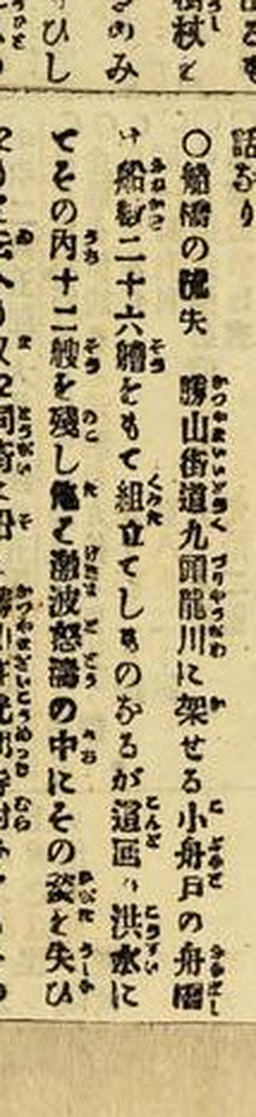の船數二十六艘をもて組立てしものなるが這回の洪水に
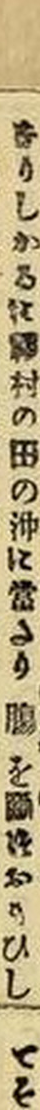なりしかるに福村の田の沖に當たり膓を斷つおもひし
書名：温古集 五巻
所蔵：福井県文書館 Fukui Prefectural Archives
